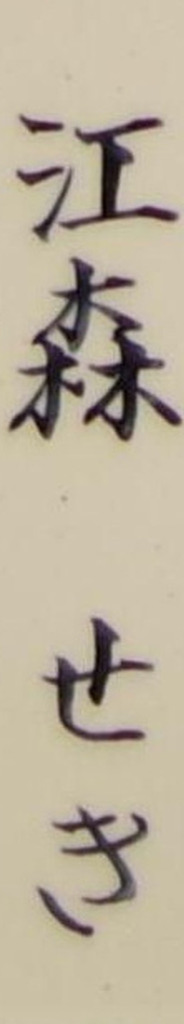江森せき
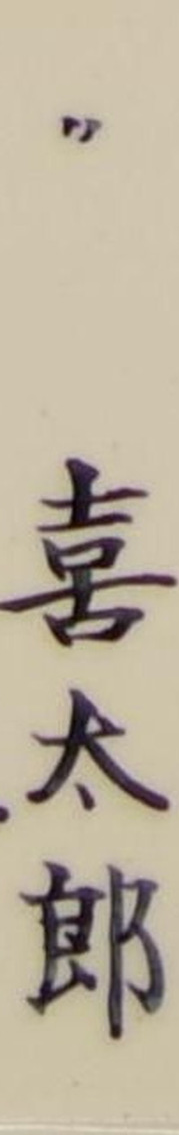喜太郎
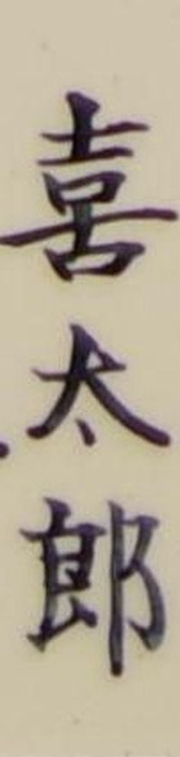喜太郎
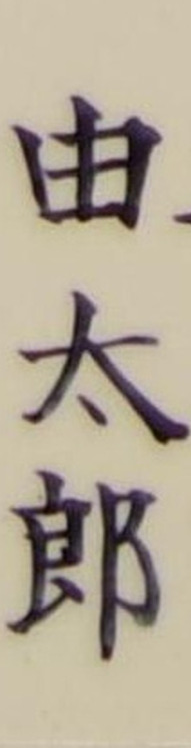由太郎
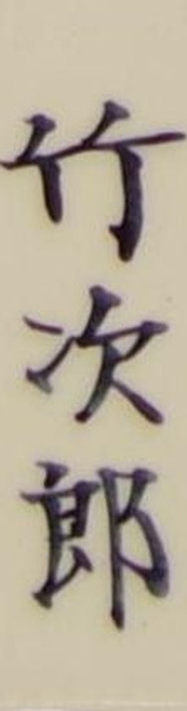竹次郎
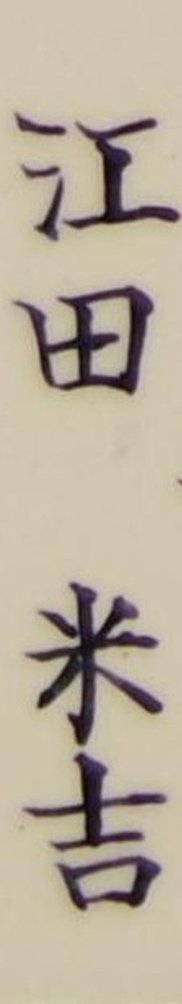江田米吉
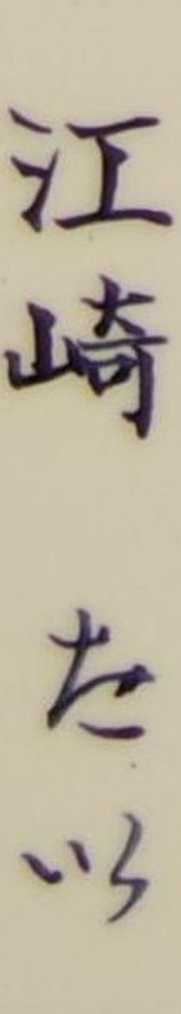江崎たい
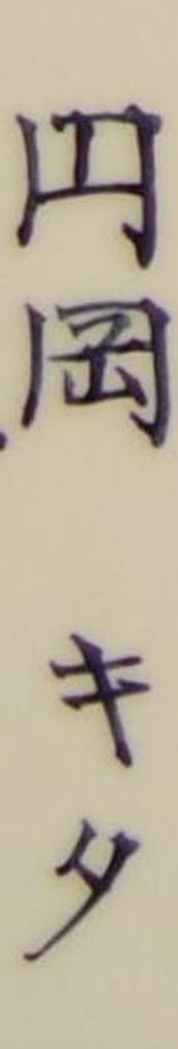円岡キタ
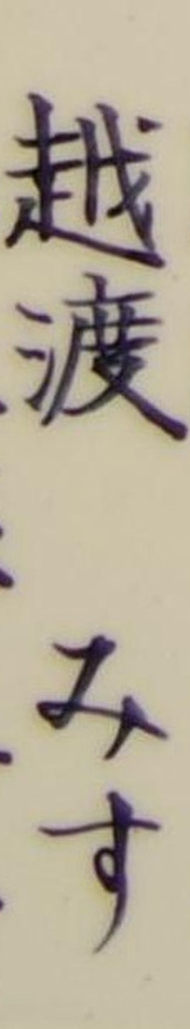越渡みす
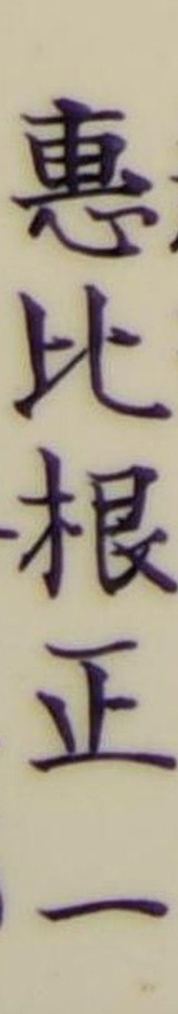恵比根正一
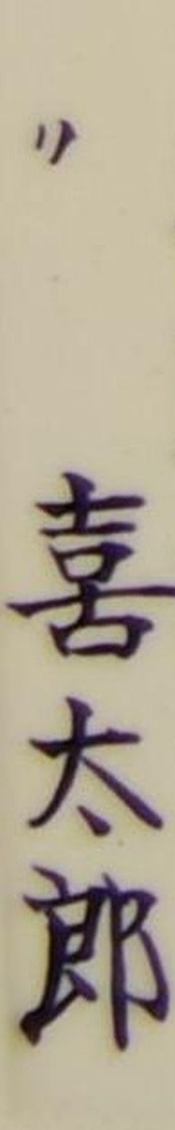喜太郎
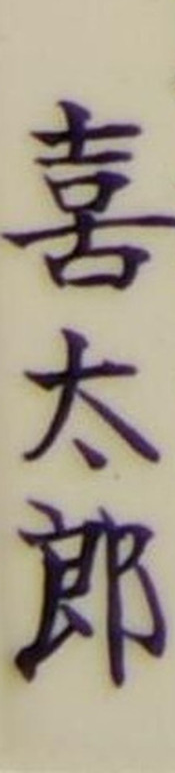喜太郎

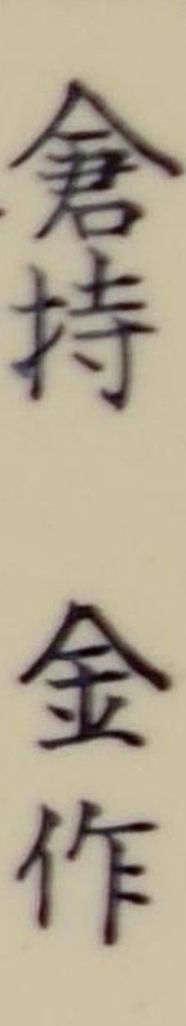倉持金作
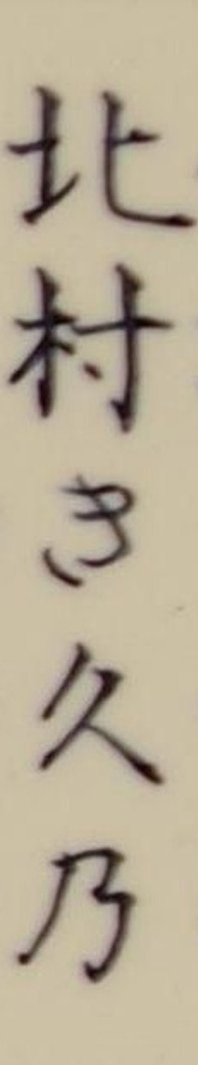北村きくの
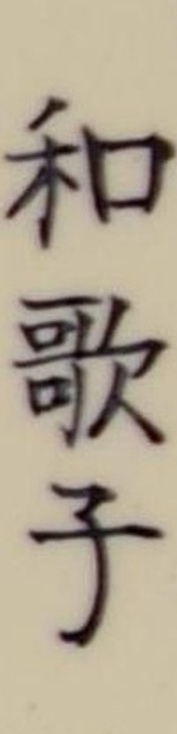和歌子
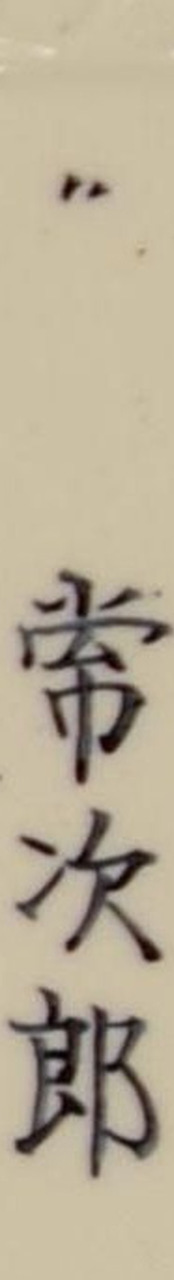常次郎
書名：E~L
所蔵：高野山金剛峯寺
